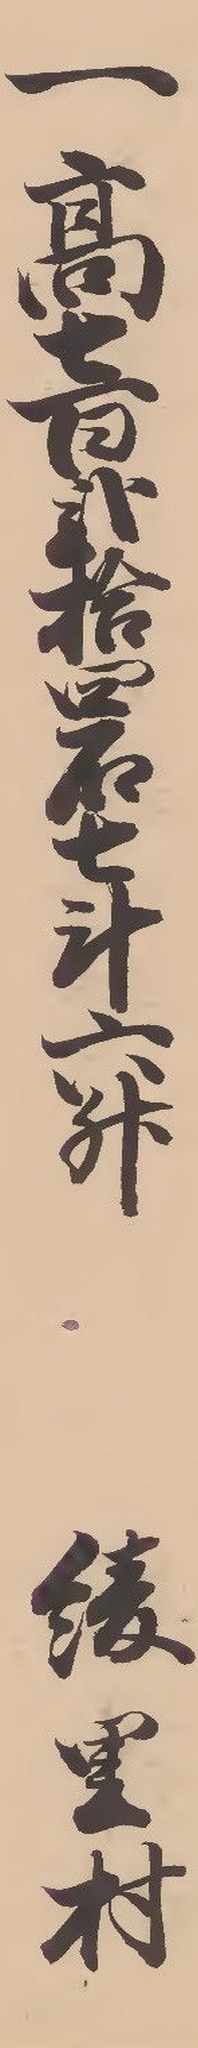一高七百弐拾四石七斗六升綾里村

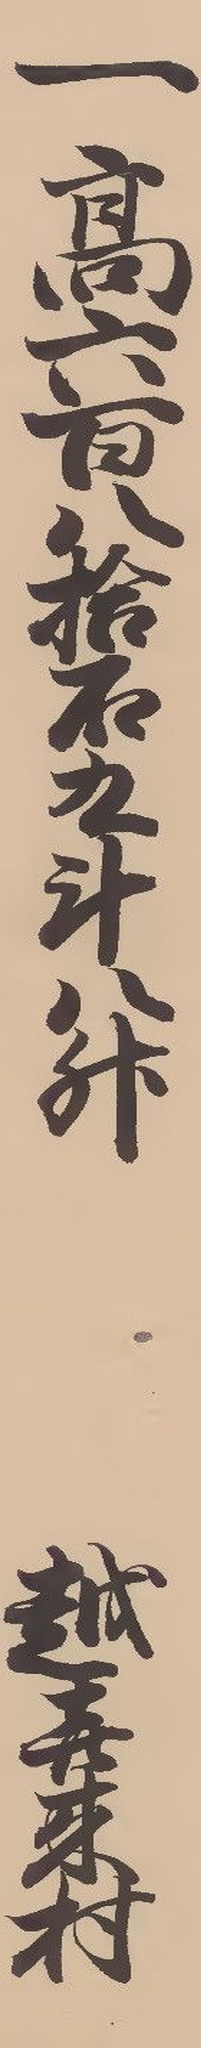一高六百八拾石九斗八升越喜来村
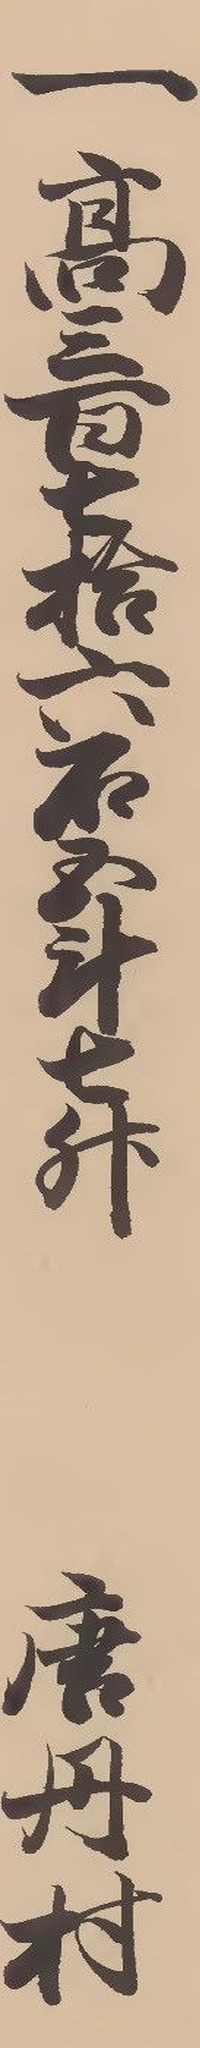一高三百七拾六石五斗七升唐丹村
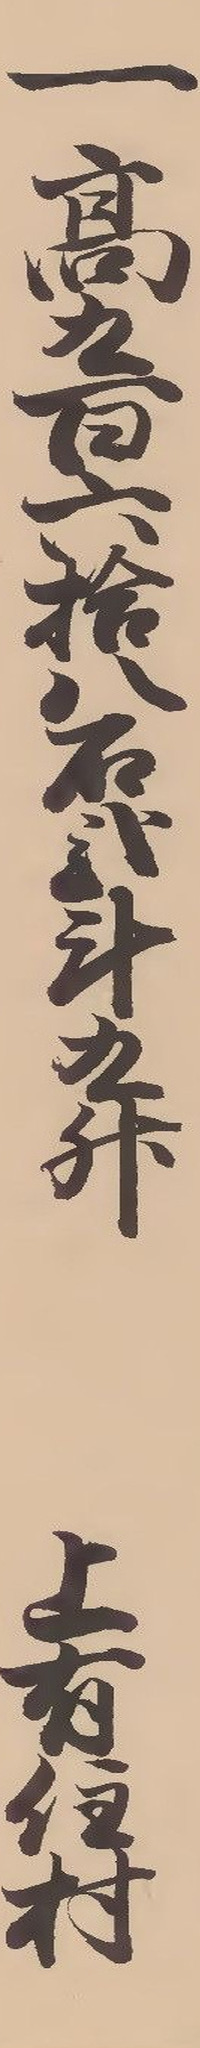一高九百六拾八石弐斗九升上有住村
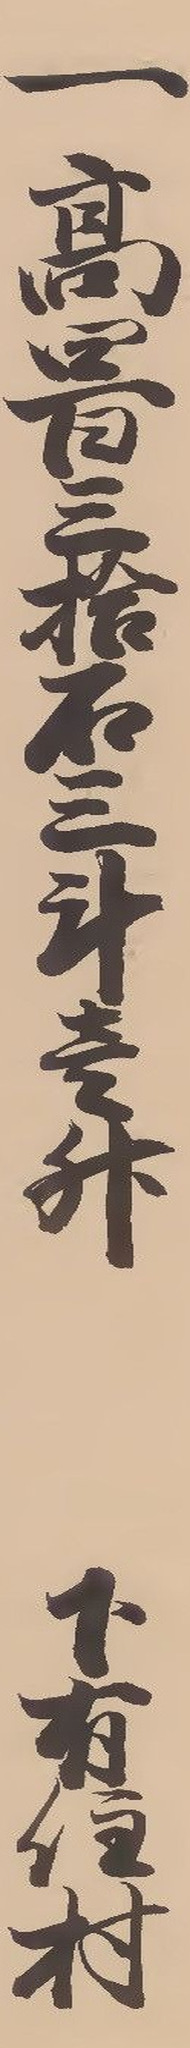一高四百三拾石三斗壱升下有住村
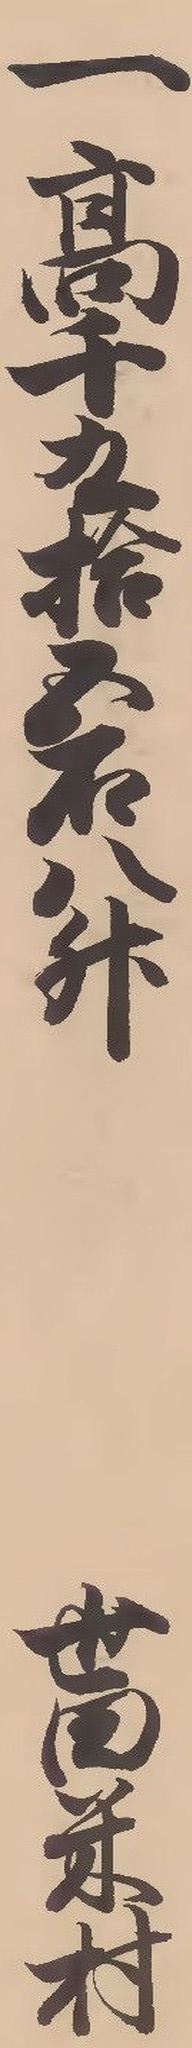一高千九拾五石八升世田米村
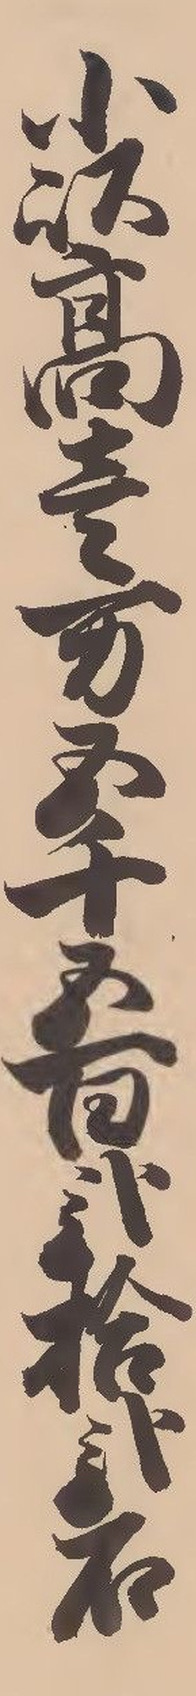小以高壱万五千五百弐拾弐石

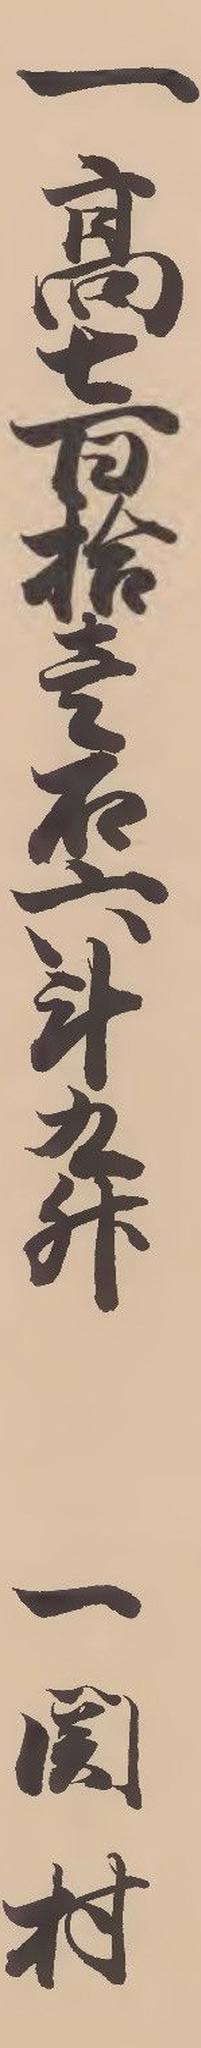一高七百拾壱石六斗九升一関村
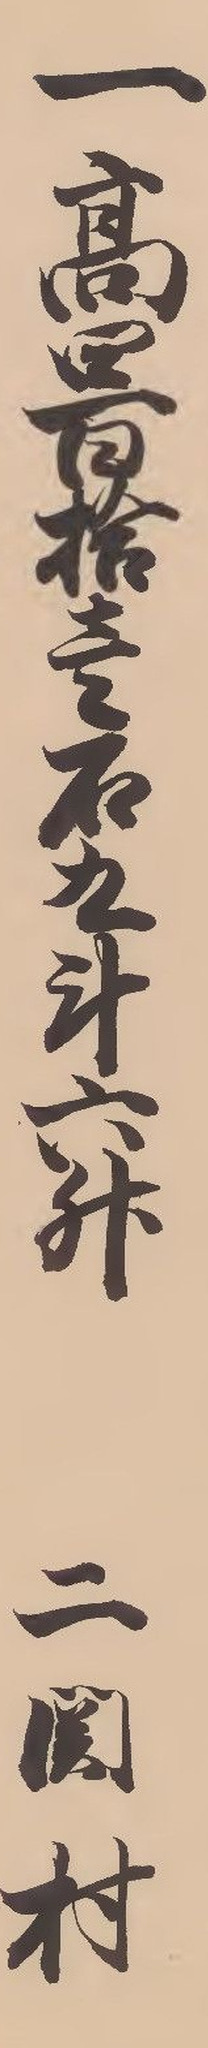一高四百拾壱石九斗六升二関村
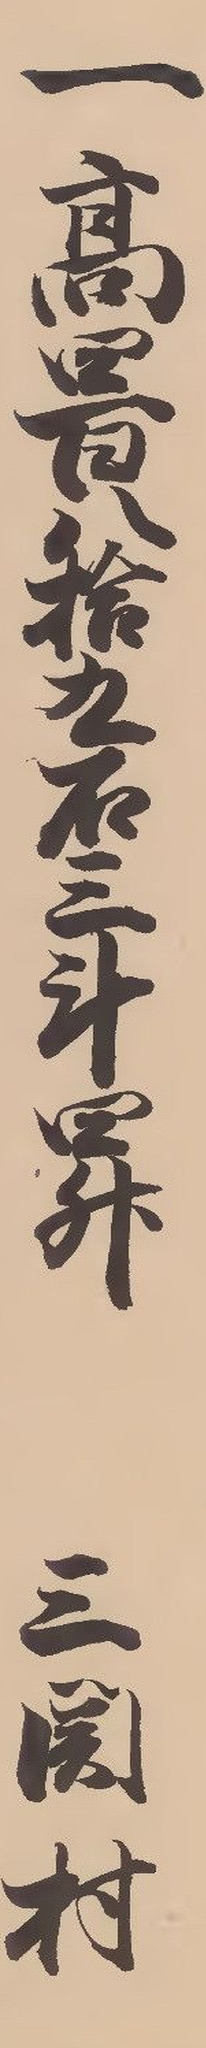一高四百八拾九石三斗四升三関村
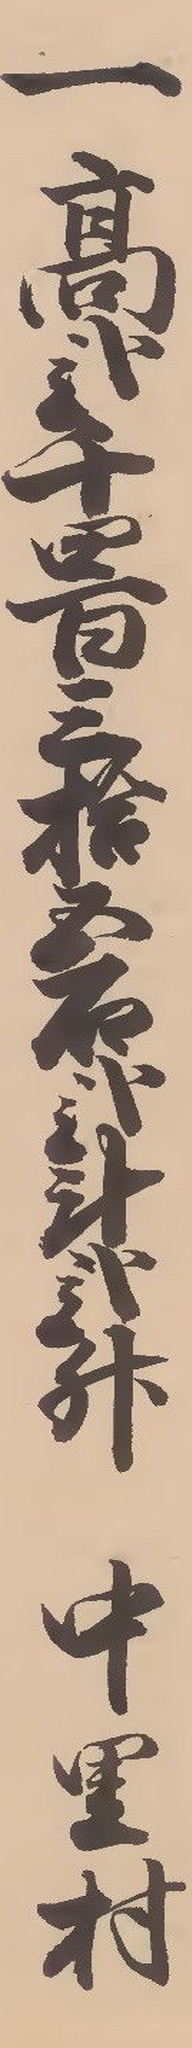一高弐千四百三拾五石弐斗弐升中里村
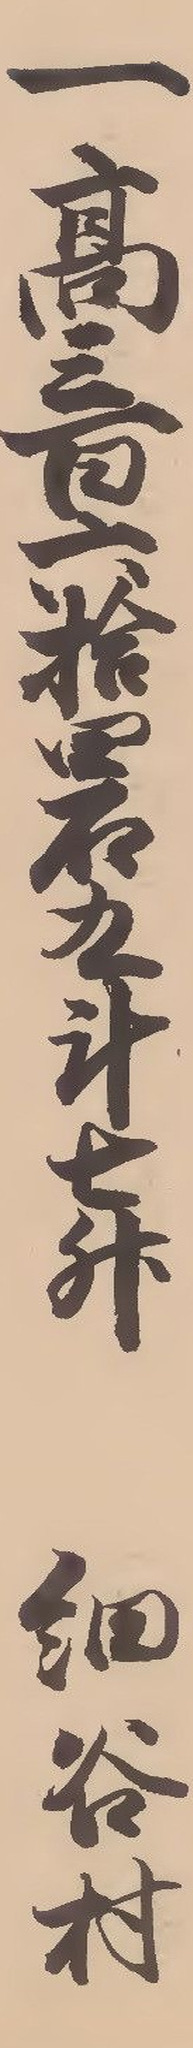一高三百六拾四石九斗七升細谷村
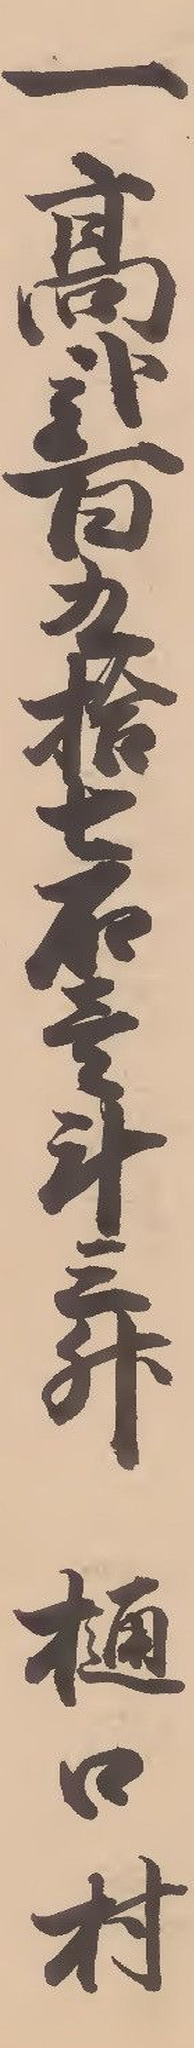一高弐百九拾七石壱斗三升樋口村
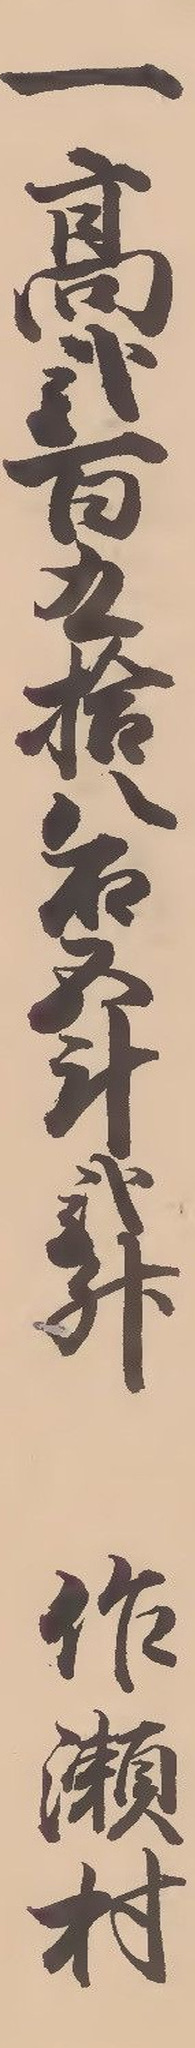一高弐百九拾八石五斗弐升作瀬村

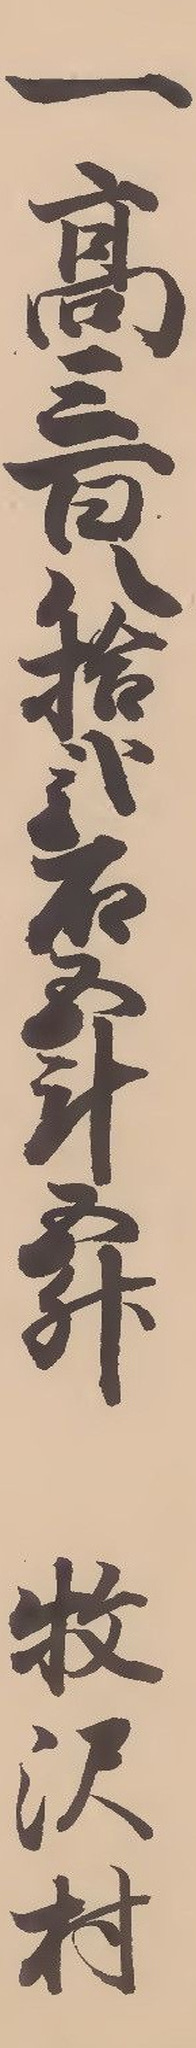一高三百八拾弐石五斗五升牧沢村
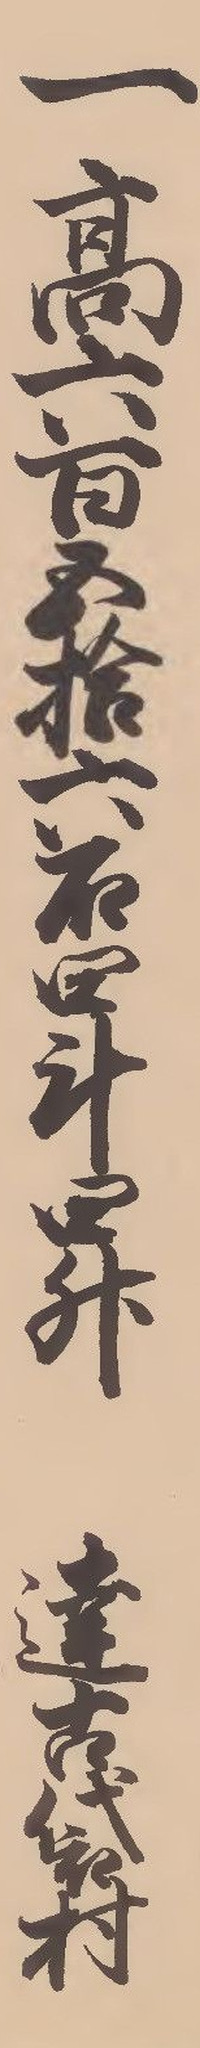一高六百五拾六石四斗四升達古袋村
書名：陸奥国郷帳　５
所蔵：国立公文書館 National Archives of Japan
